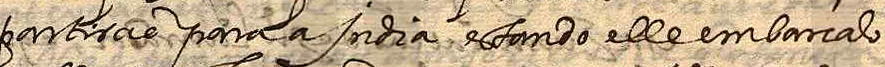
partiraõ para a Jndia estando elle embarcado
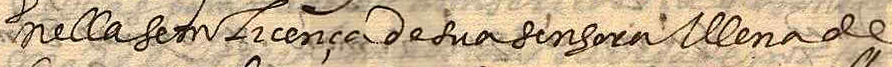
nella sem Licença de sua senhora Illena de
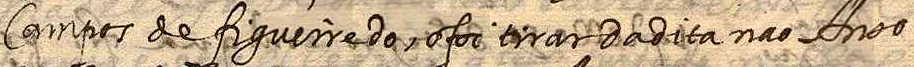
Campos de figueiredo o foi tirar da dita nao Anto
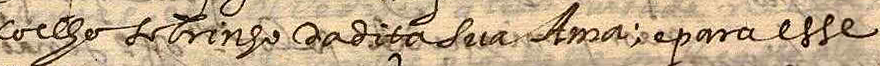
coelho sobrinho da dita sua Ama; e para esse
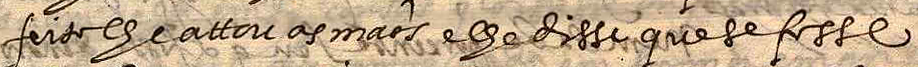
feito lhe attou as maõs e lhe disse que se fosse
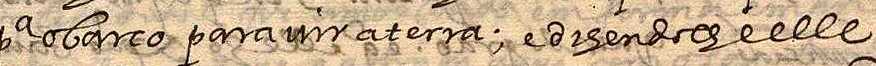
pa o barco para vir a terra; e dizendolhe elle
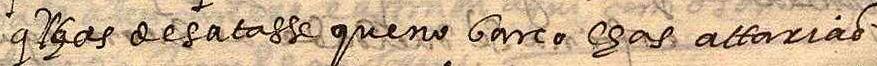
q̄ lhas desatasse que no barco lhas attariaõ
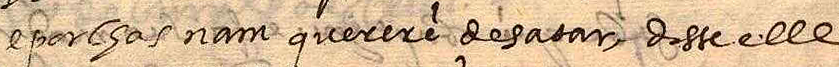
e por lhas nam quererē desatar, disse elle
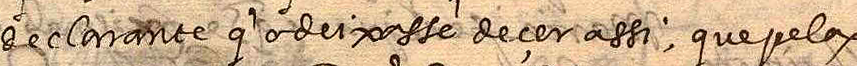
declarante q̄ o deixassē deçer assi, que pelas
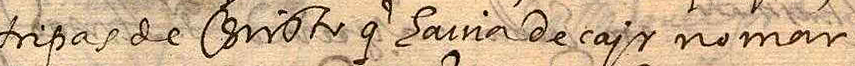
tripas de Christo q̄ havia de cajr no mar
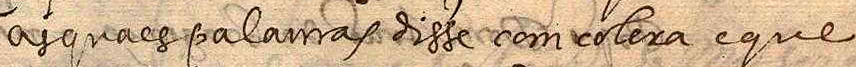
as quaes palavras disse com colera e que
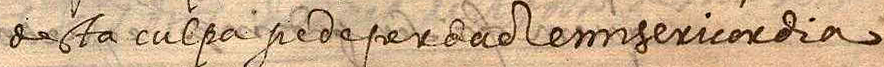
desta culpa pede perdaõ e misericordia
